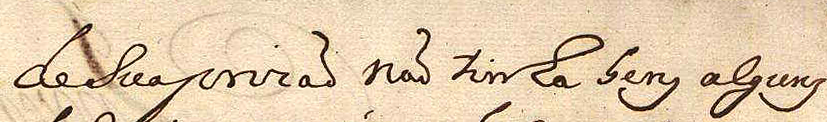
de sua prizaõ naõ tinha bens alguns
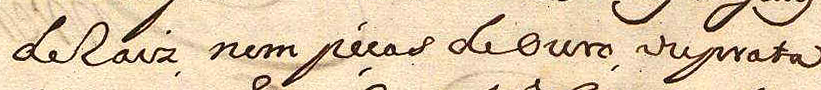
de Raiz, nem péças de ouro, ou prata
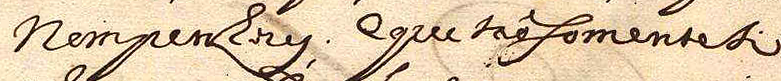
nem penhores; e que taõ somente ti
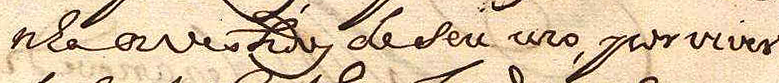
nha oz vestidos de seu uzo, por viver
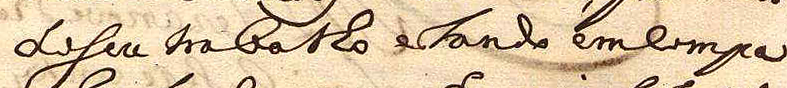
do seu trabalho estando em compa
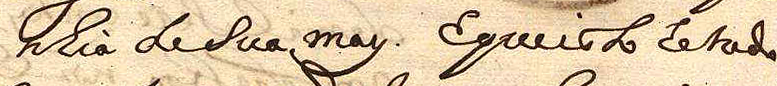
nhia de sua may. E que isto he tudo
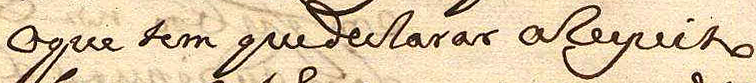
o que tem que declarar a Respeito
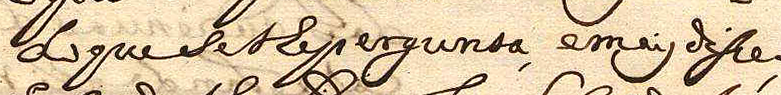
do que Se lhe pergunta, e mais disse,
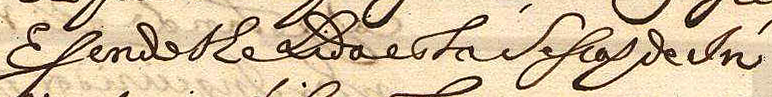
E sendolhe Lida esta Sessaõ de In
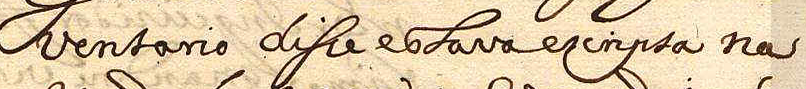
ventario disse estava escripta na
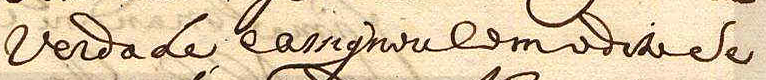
Verdade e assignou com o dito Se
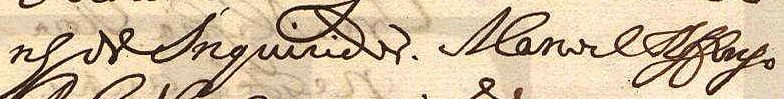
nhor Inquizidor. Manoel Affonso
